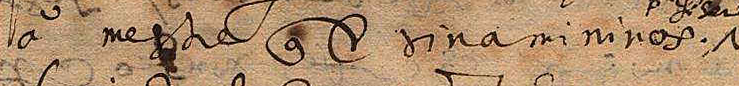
ao mestre q̄ e̅sina mininos.
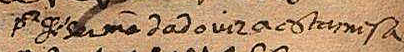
por lhe ser mādado uir a esta mesa
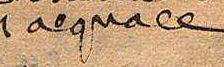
ao quall
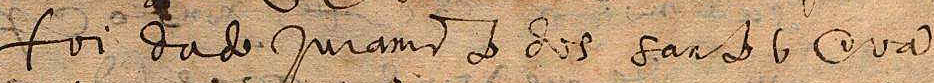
foi dado Juramēto dos santos evā
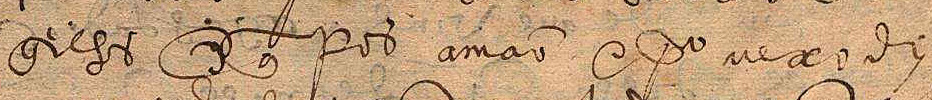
gelhos ē q̄ pos a maõ e p̄oneteo dy
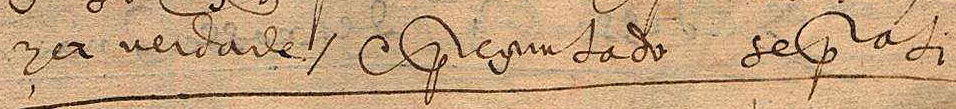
zer uerdade / e p̄reguntado se prati
